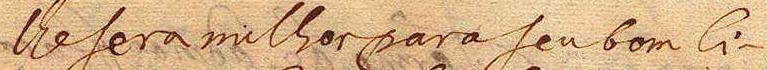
lhe sera milhor para seu bom li
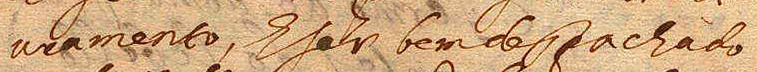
uramento, E ser bem despachado
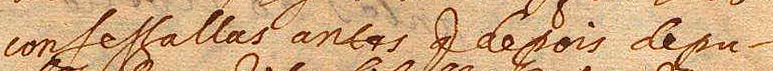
confessallas antes q̄ depois de pu
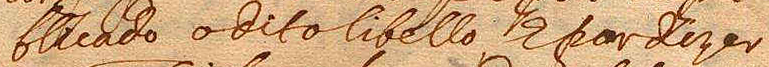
blicado o dito libello, E por dizer
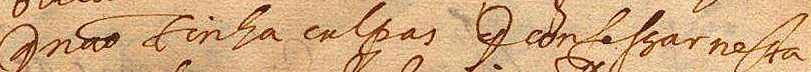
q̄ não tinha culpas q̄ confessar nesta
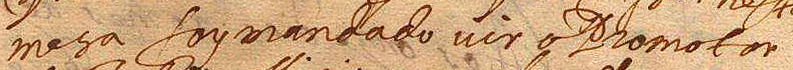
mesa foy mandado uir o Promotor
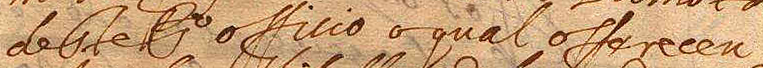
deste sto officio o qual offereceu
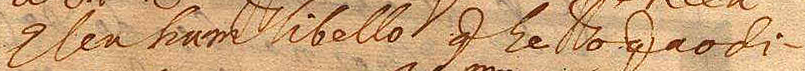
E leu hum libello q̄ he o q̄ ao di
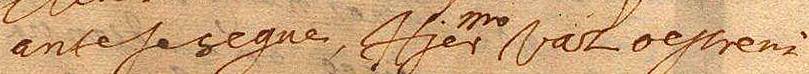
ante se segue, Hjermo Vaz o escreui
